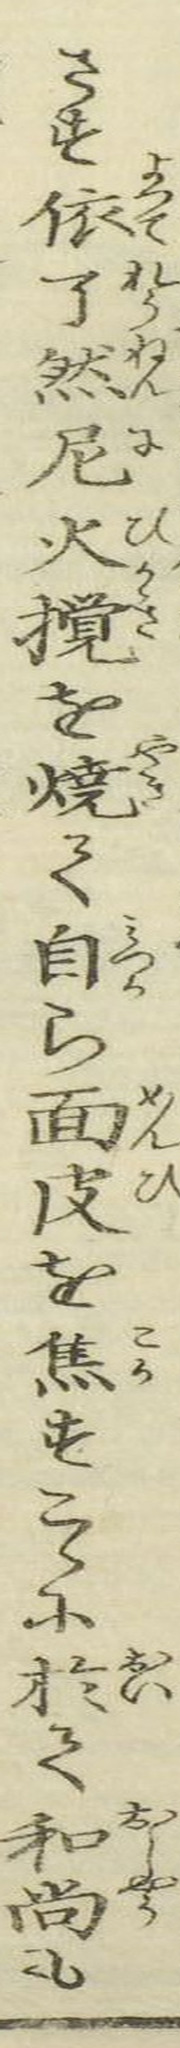さす依了然尼火撹を焼て自ら面皮を焦すこゝに於て和尚も
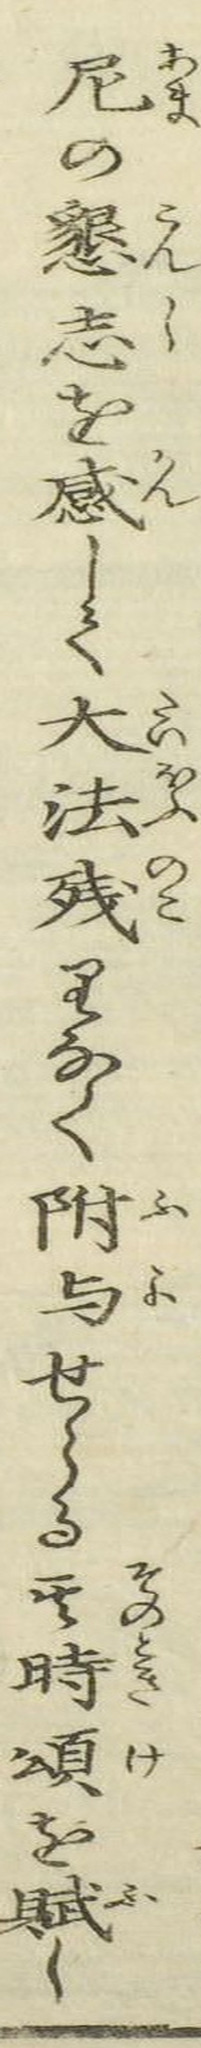尼の懇志を感して大法残りなく附与せらる其時頌を賦し
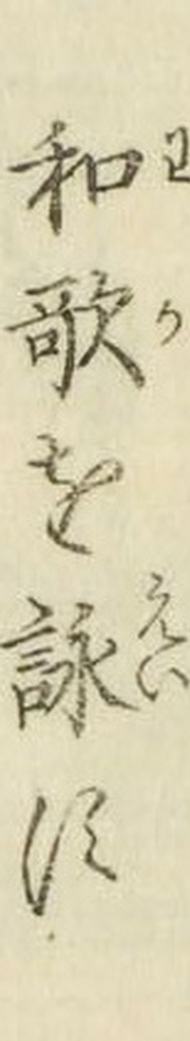和歌を詠す
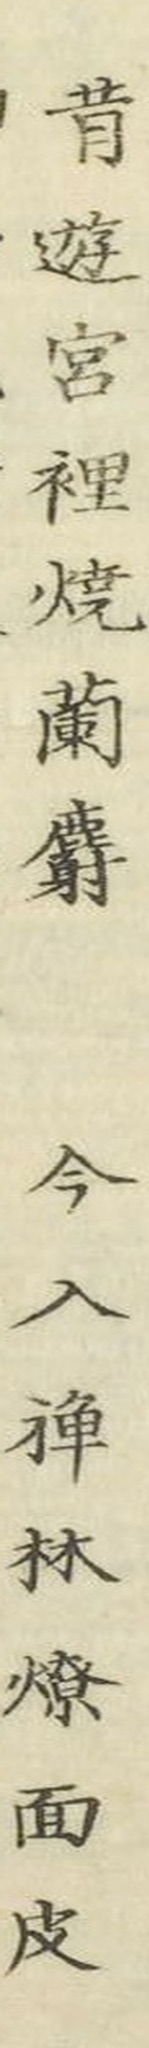昔遊宮裡焼蘭麝今入禅林燎面皮
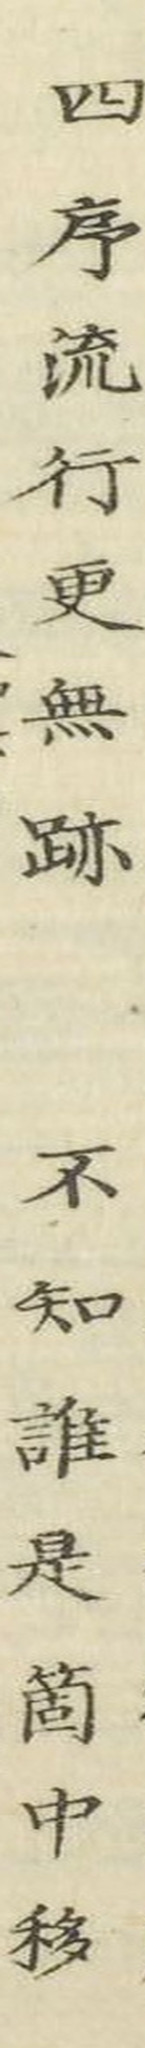四序流行更無跡不知誰是箇中移
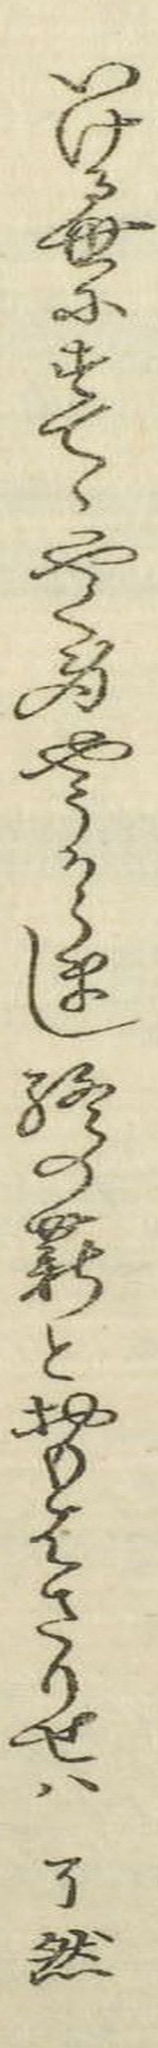いける世にすてゝやく身やうからまし終の薪とおもはさりせは了然
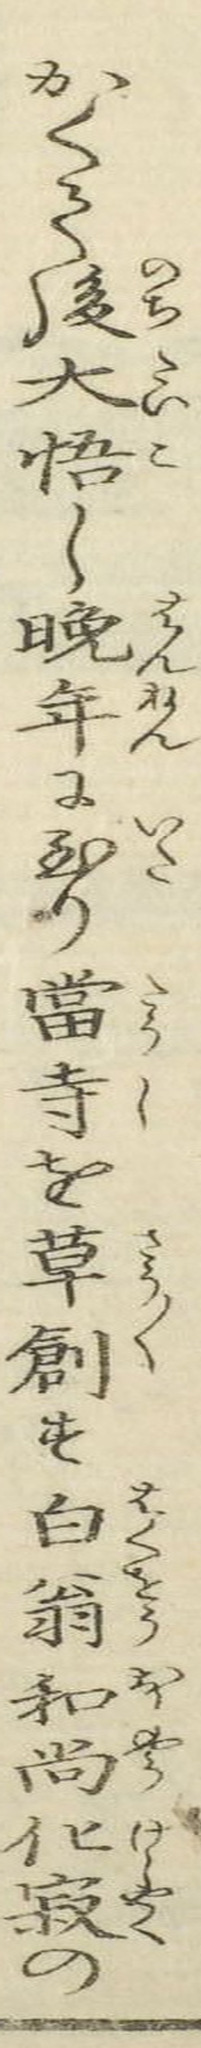かくて後大悟し晩年に至り當寺を草創す白翁和尚化寂の
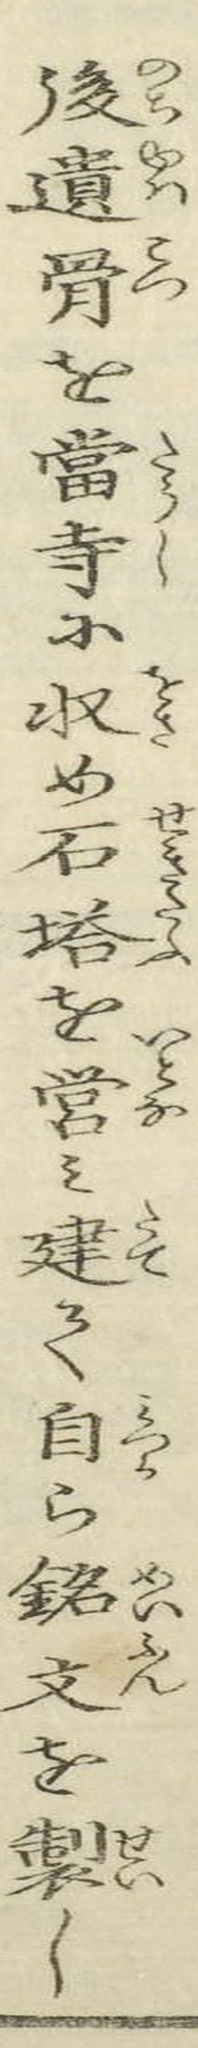後遺骨を當寺に収め石塔を営み建て自ら銘文を製し
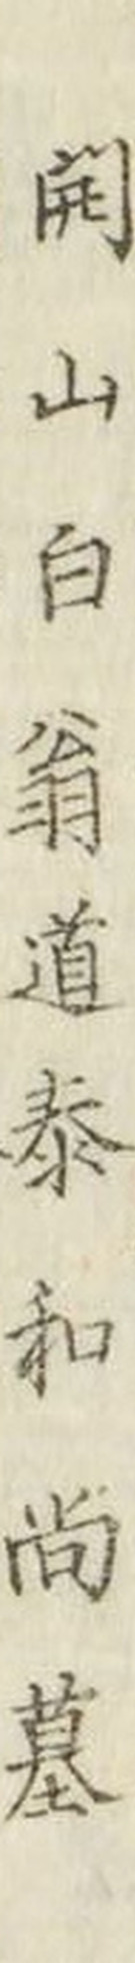開山白翁道泰和尚墓
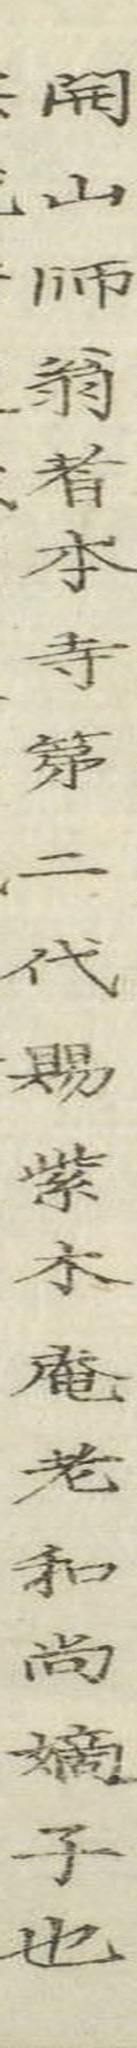開山師翁者本寺第二代賜紫木庵老和尚嫡子也
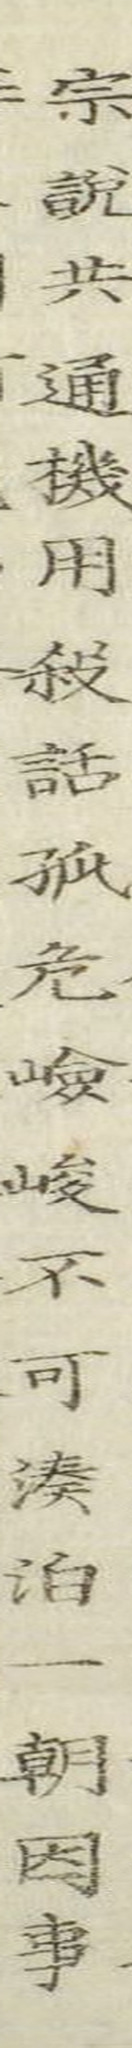宗説共通機用殺話孤危嶮峻不可湊泊一朝因事
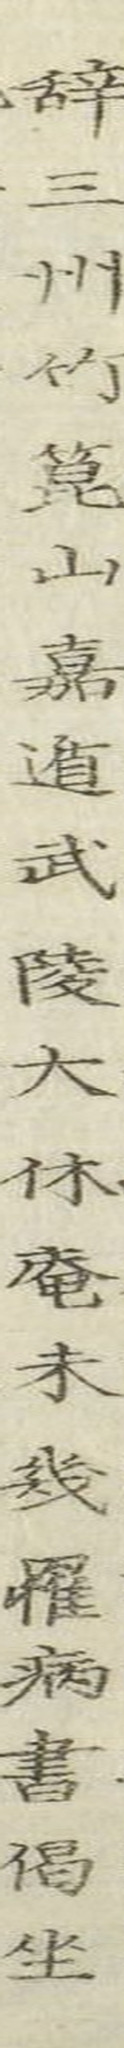辞三州竹箟山嘉遁武陵大休庵未幾罹病書偈坐
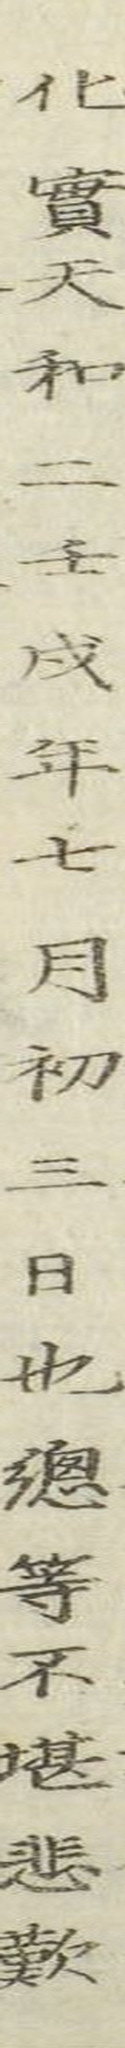化實天和二壬戌年七月初三日也緫等不堪悲歎
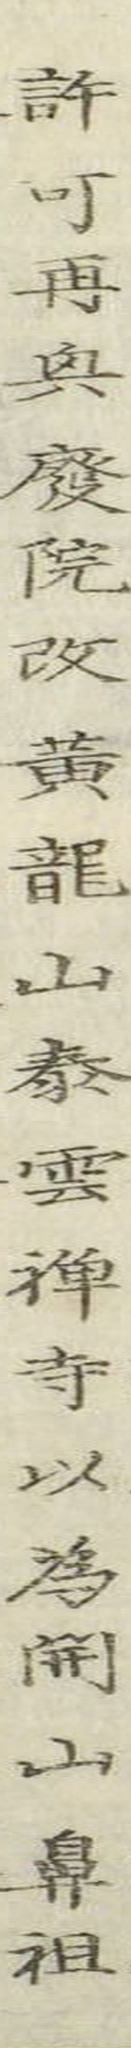許可再興廢院改黄龍山泰雲禅寺以為開山鼻祖
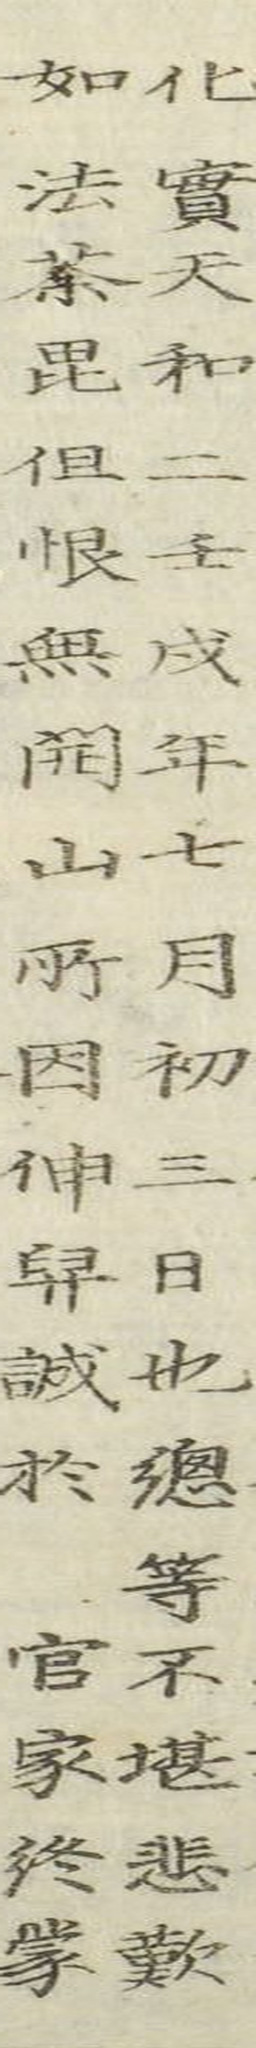如法荼毘但恨無開山所因伸舁誠於官家終蒙
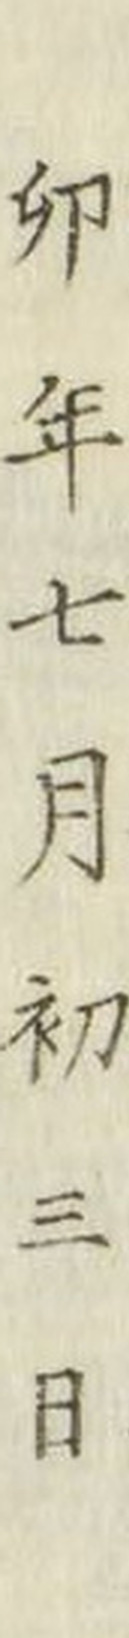卯年七月初三日
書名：江戸名所図会 20巻 巻之12
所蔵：東京学芸大学教育コンテンツアーカイブ
